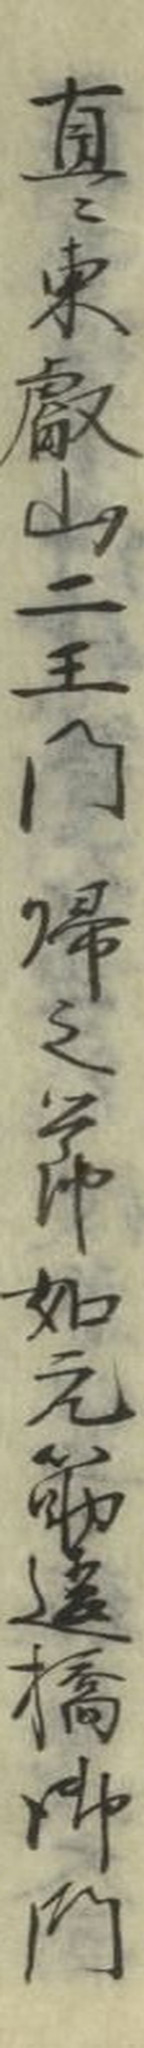直に東叡山二王門帰之節如元筋違橋御門
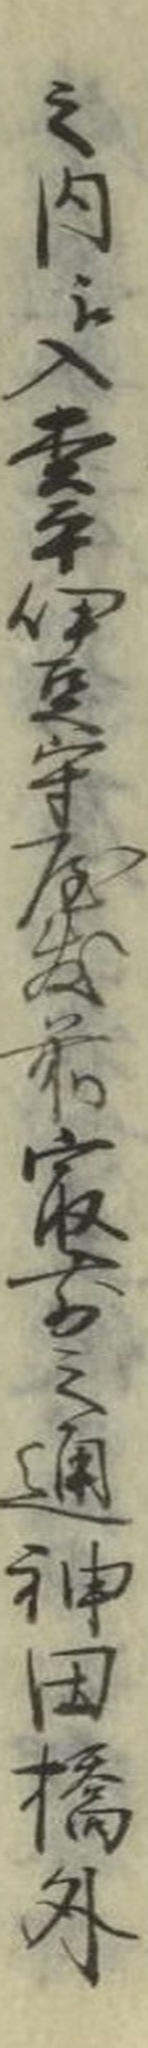之内え入松平伊豆守屋敷前最前之通神田橋外
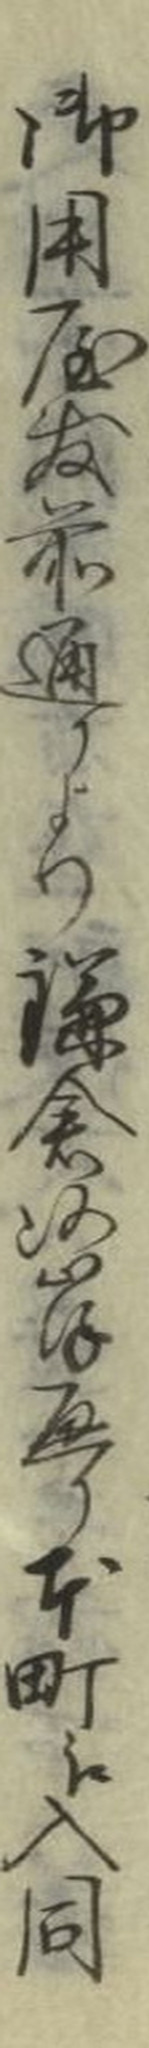御用屋敷前通りより鎌倉河岸通り本町え入同
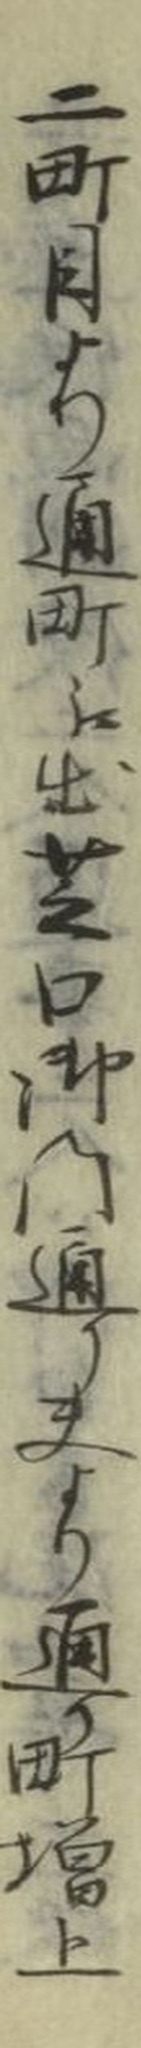二町目より通町え出芝口御門通り夫より通り町増上
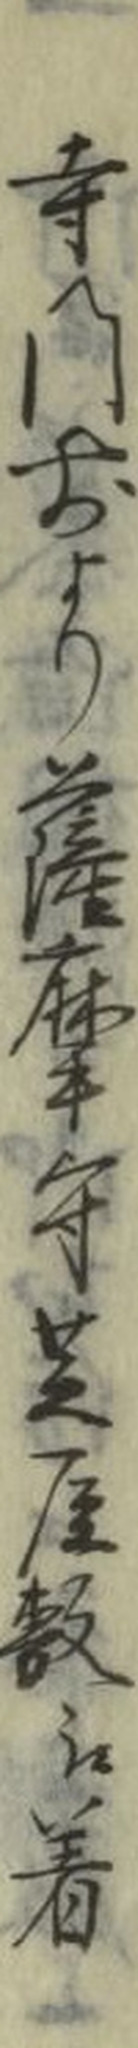寺門前より薩摩守芝屋敷え着
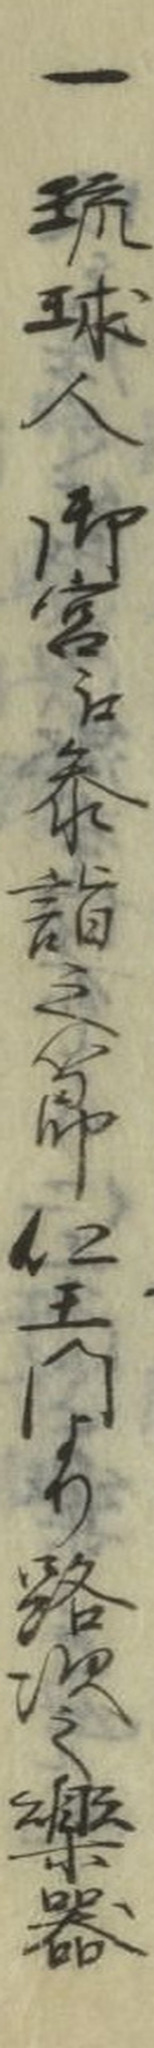一琉球人御宮え参詣之節仁王門より路次之楽器

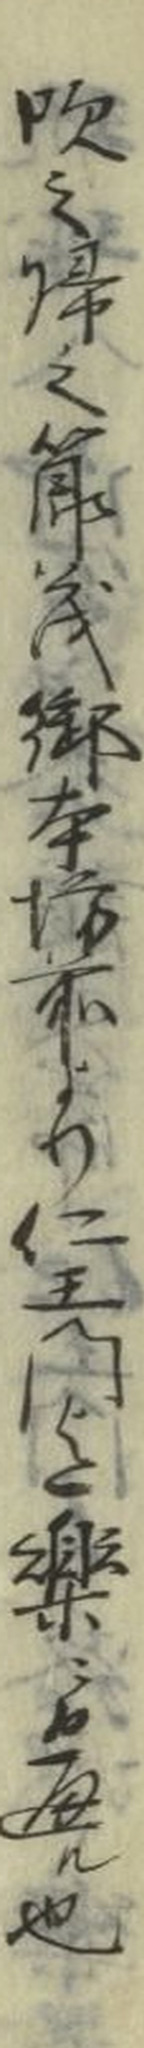吹之帰之節も御本坊前より仁王門迄楽に而通る也
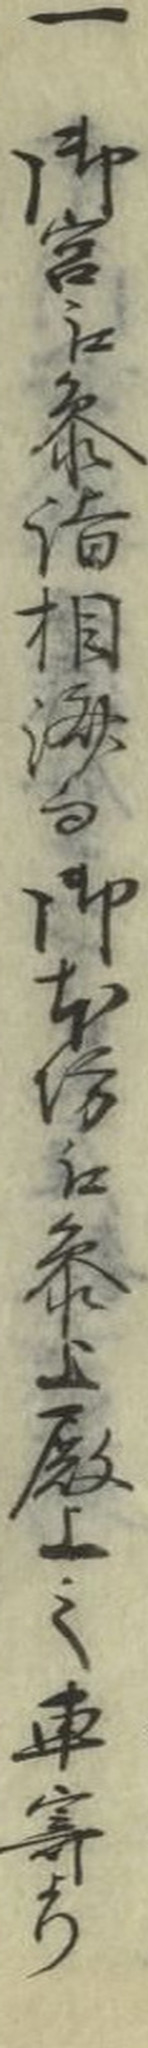一御宮え参詣相済而御本坊え参上殿上之車寄より
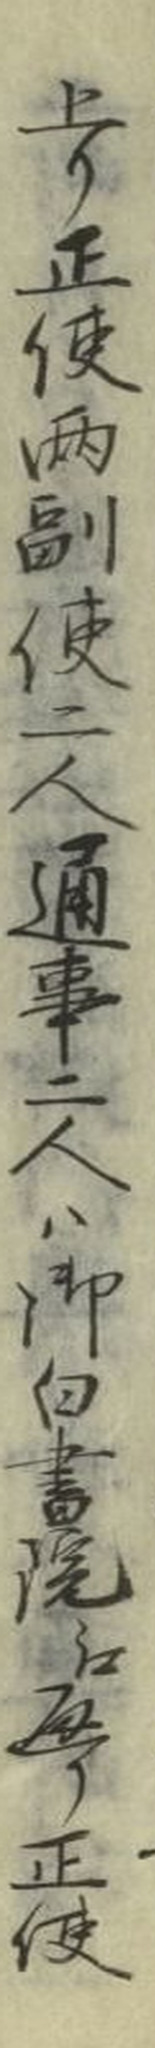上り正使両副使二人通事二人は御白書院え通り正使
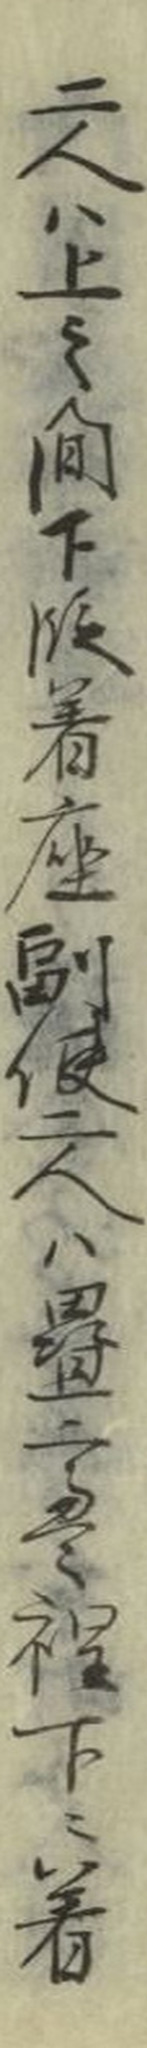二人は上之間下段着座副使二人は畳二畳程下に着
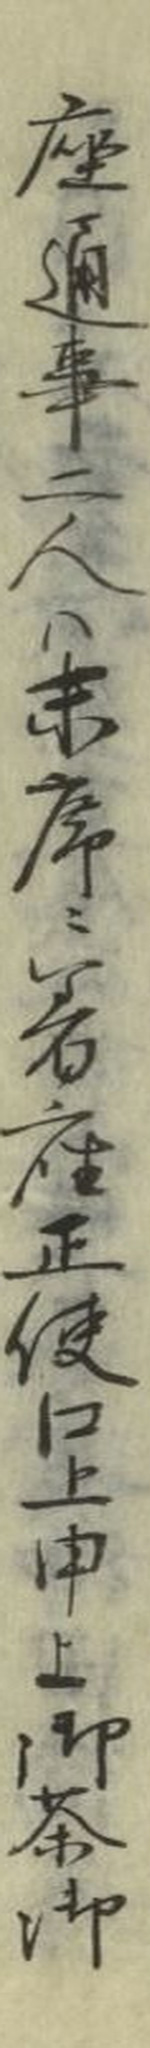座通事二人は末席に着座正使口上申上御茶御
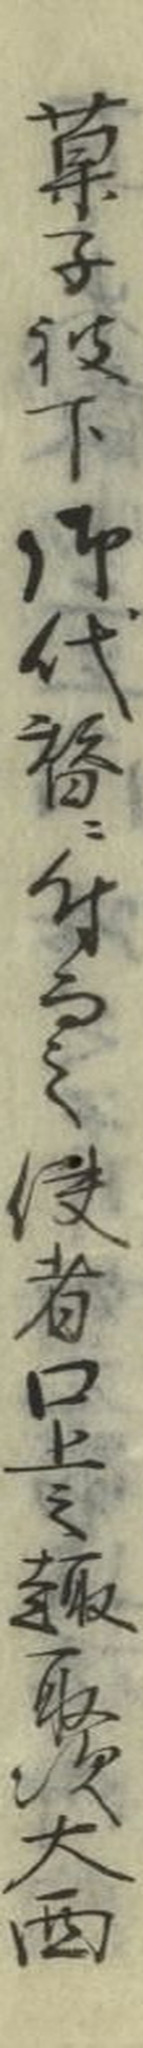菓子被下御代替に付而之使者口上之趣取次大西
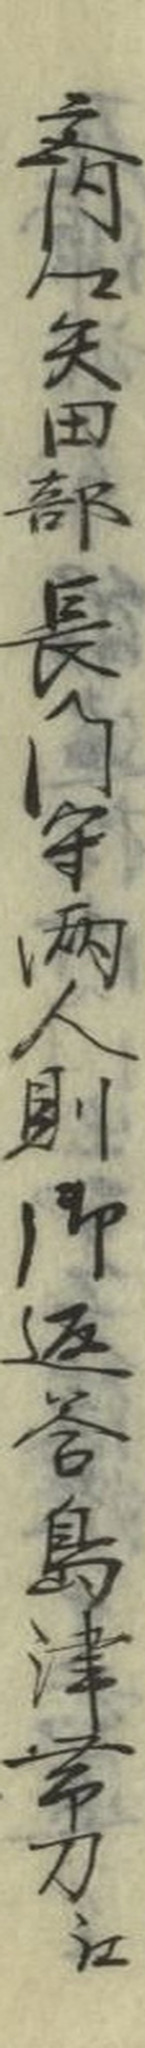宮内卿矢田部長門守両人則御返答島津帯刀え
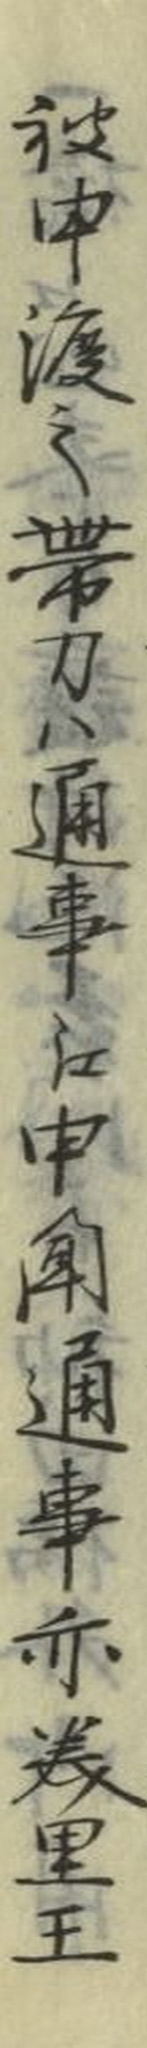被申渡之帯刀は通事え申聞通事亦美里王
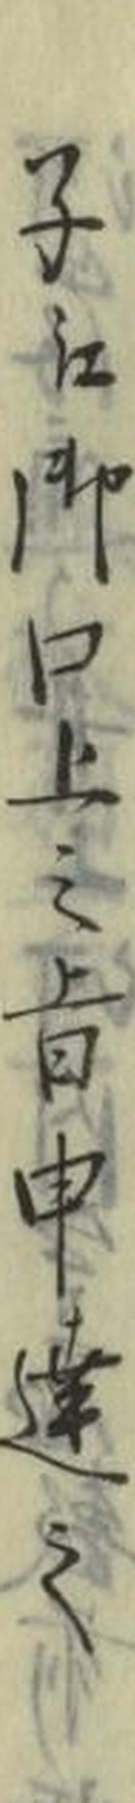子え御口上之旨申達之
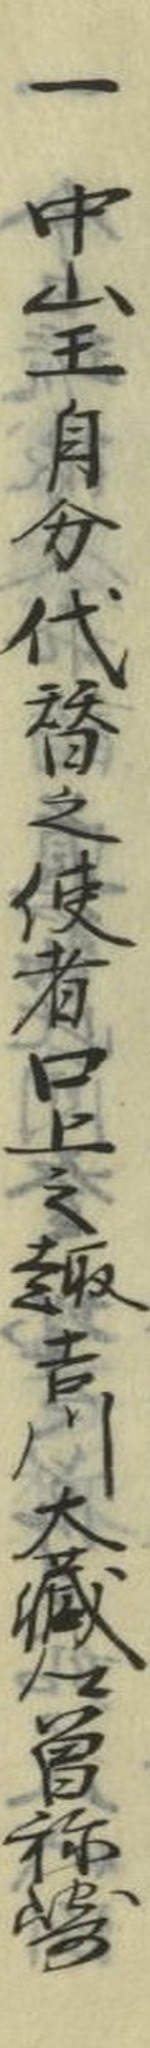一中山王自分代替之使者口上之趣吉川大蔵卿曽祢崎
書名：宝永七庚寅年琉球国来聘使日記
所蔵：University of the Ryukyus Library
